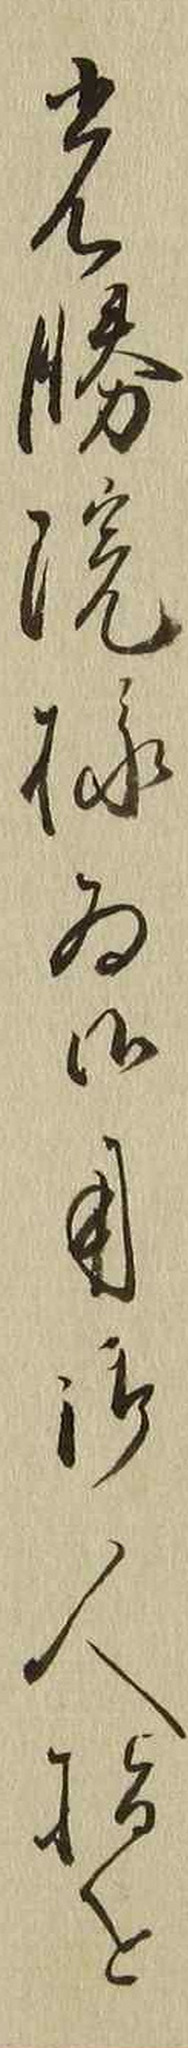光勝院様為御用御人指を
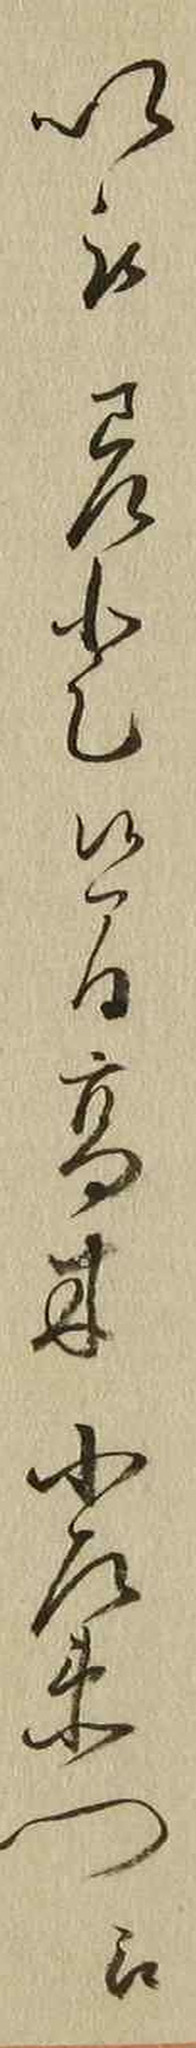以被差登候間高木小左衛門江
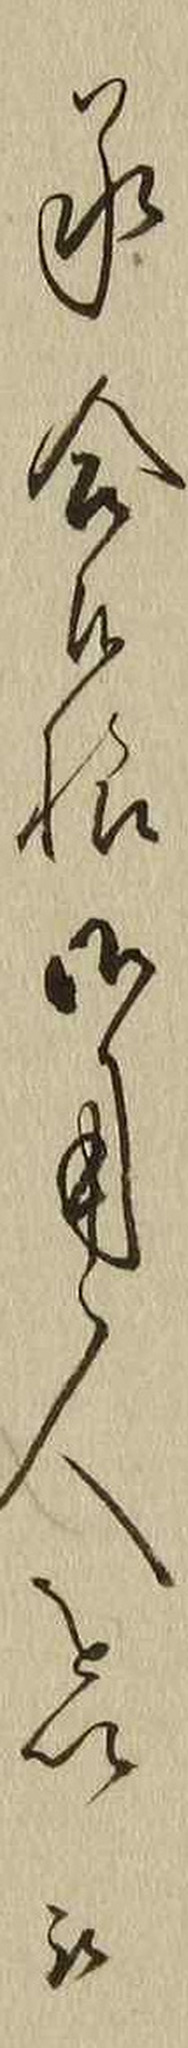承合候様御用人を以被
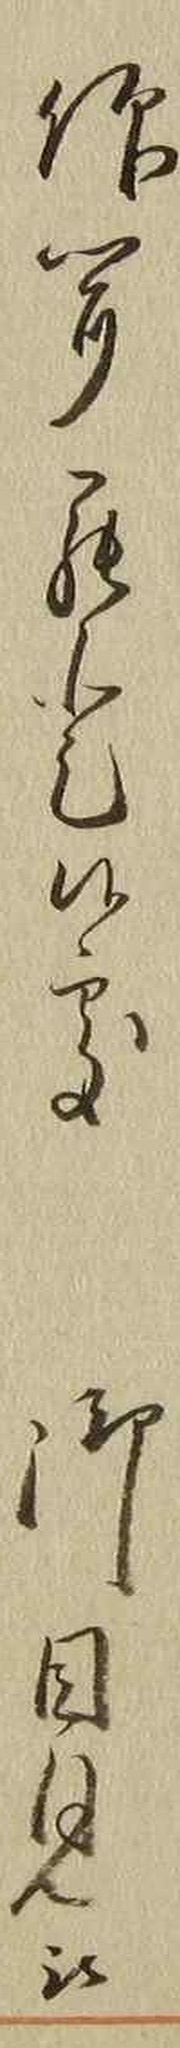仰聞罷登候處御目見被
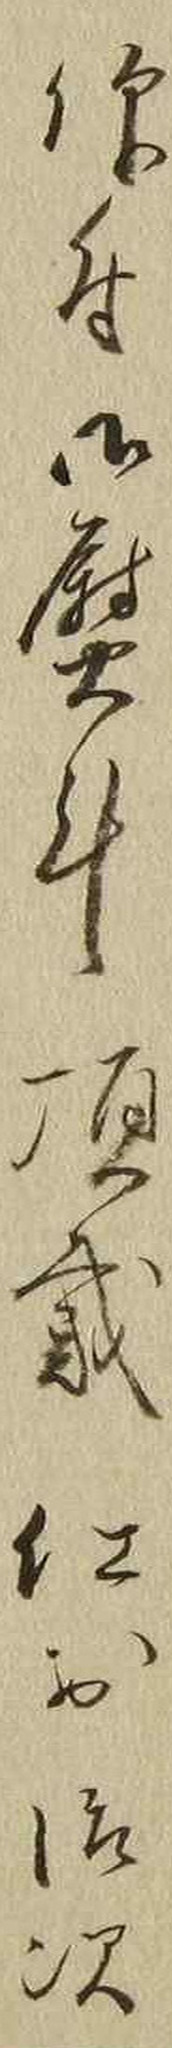仰付御熨斗頂戴仕於御次
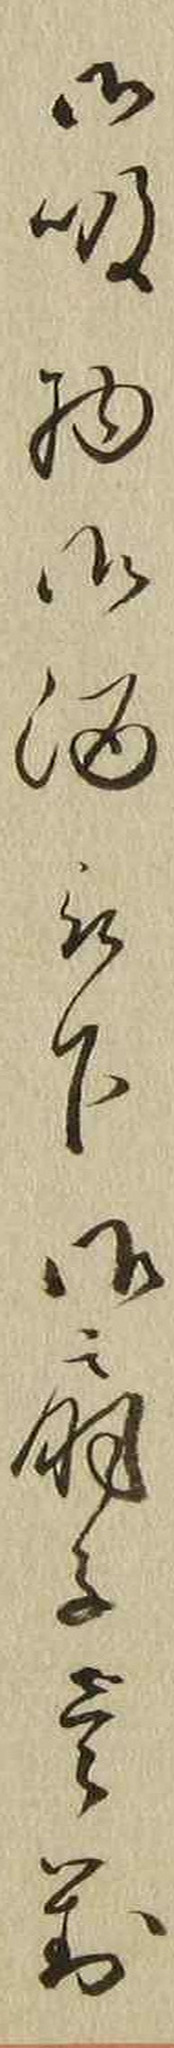御吸物御酒被下御扇子壱対
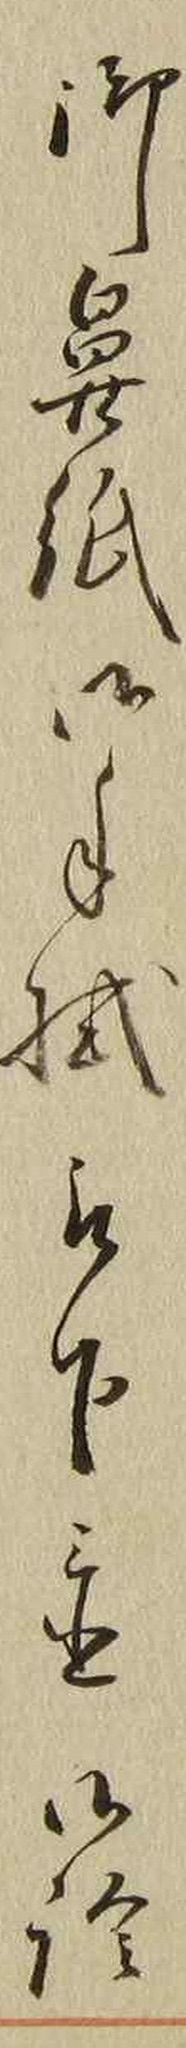御鼻紙御手拭被下置御診
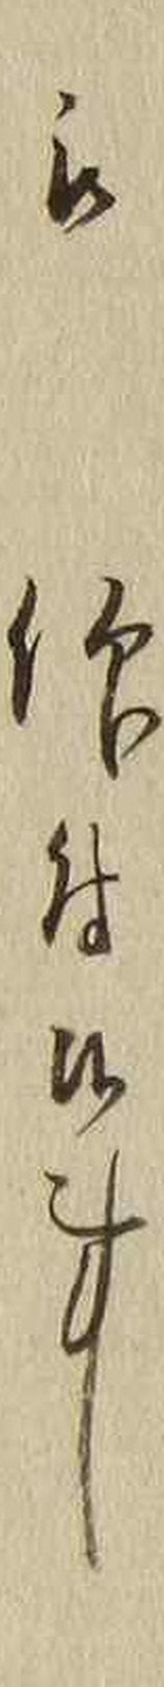被仰付候事
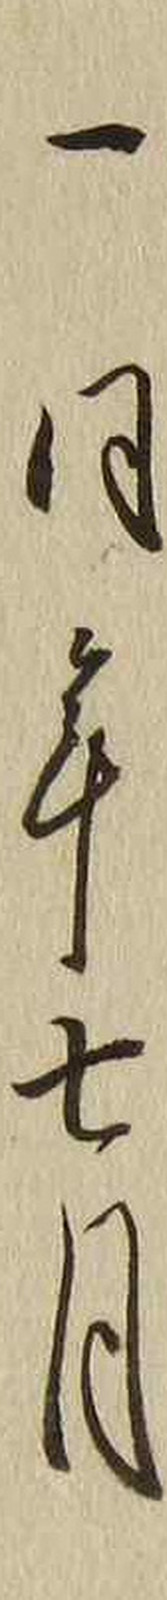一同年七月
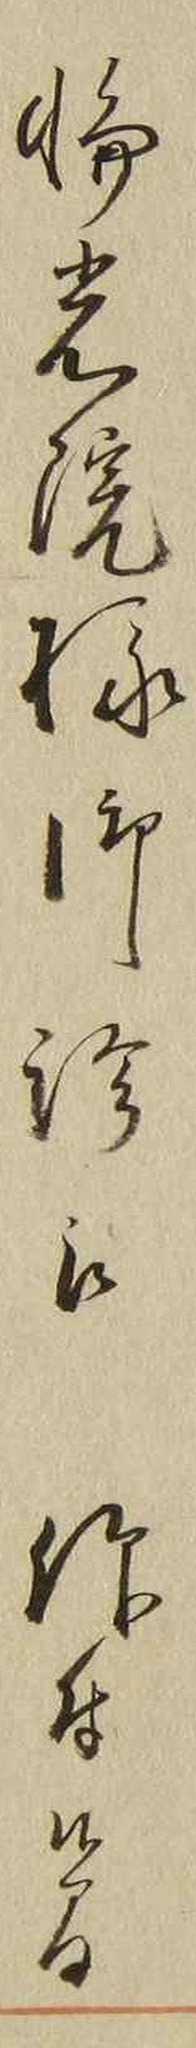輪光院様御診被仰付候間
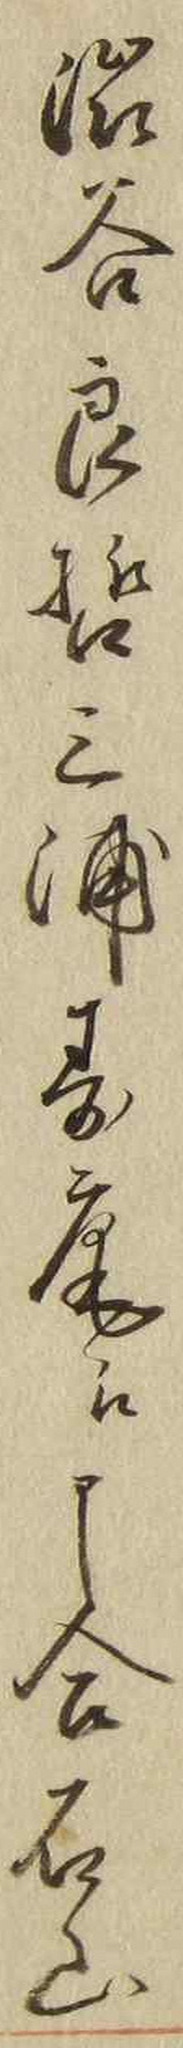渋谷良哲三浦寿庵被申合石山

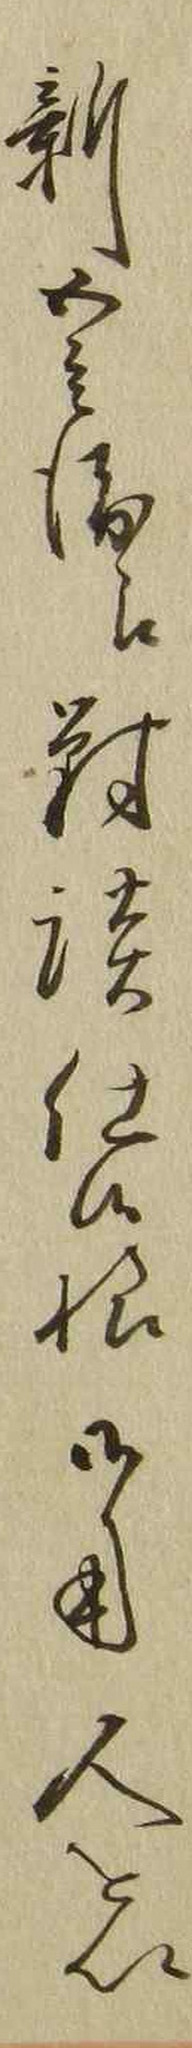新五兵衛江対談仕候様御用人を以
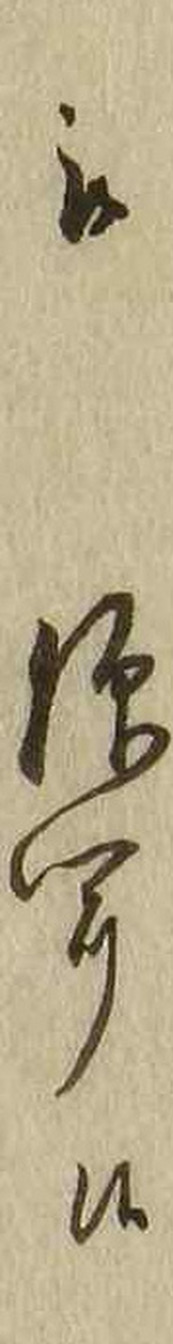被仰聞候
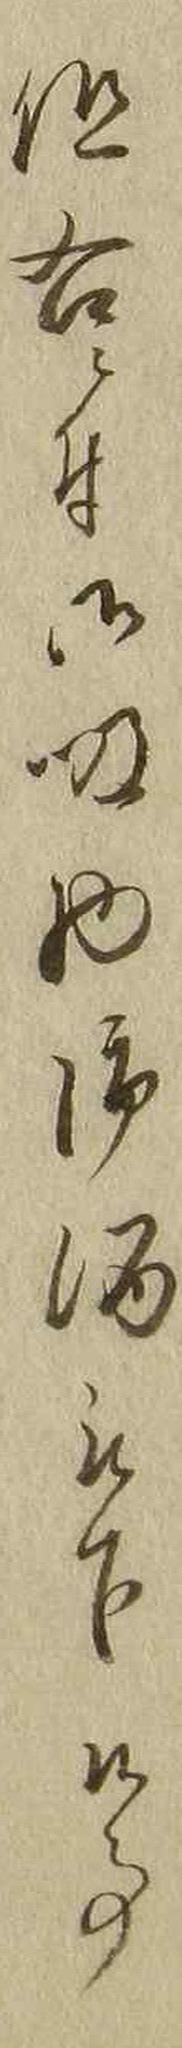但右ニ付御吸物御酒被下候事
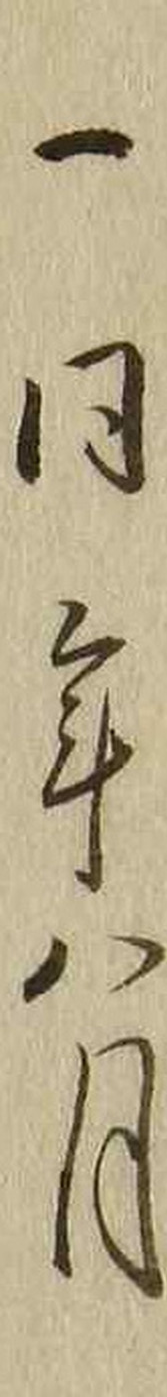一同年八月
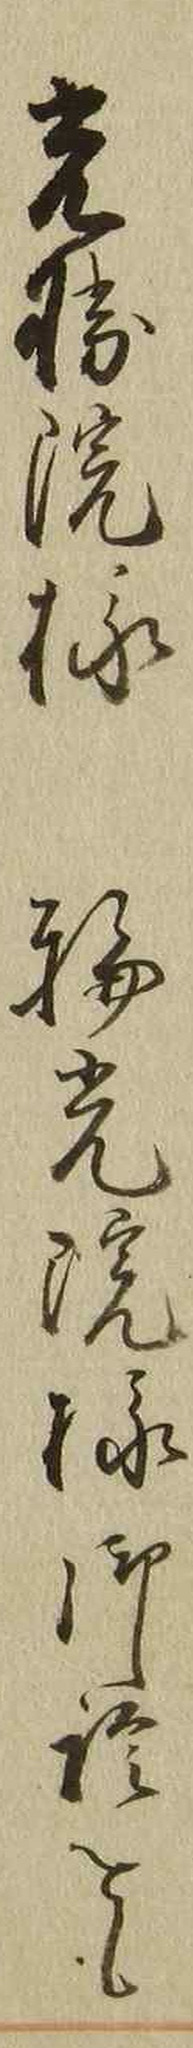光勝院様輪光院様御診をも
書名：諸士系譜　巻之68　を之部2
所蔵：会津若松市立会津図書館
